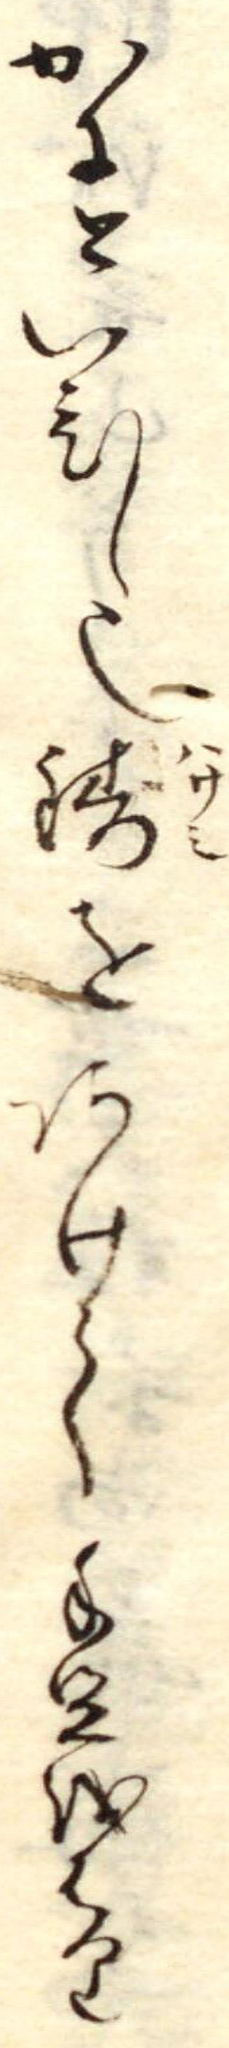かにといひし也錡をさけて手足をはり
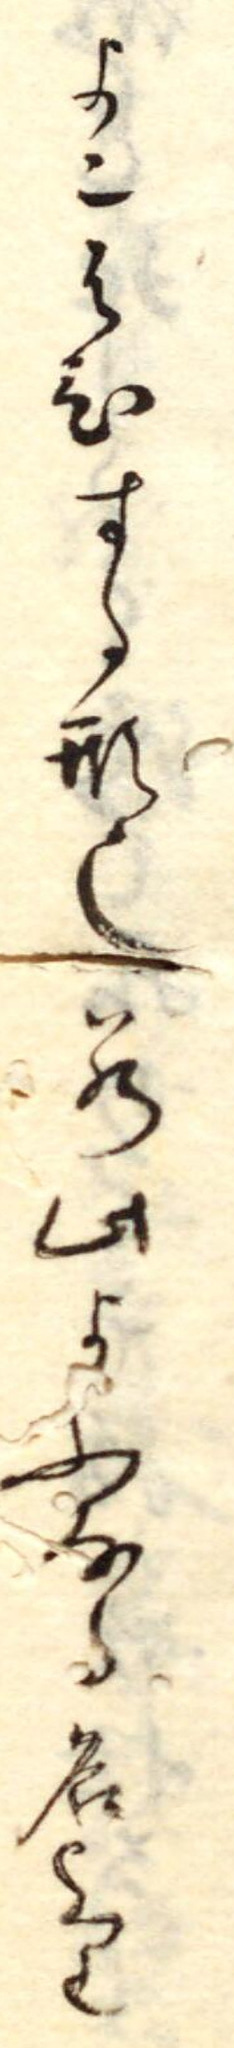よこはひする形也若此よふなる名より
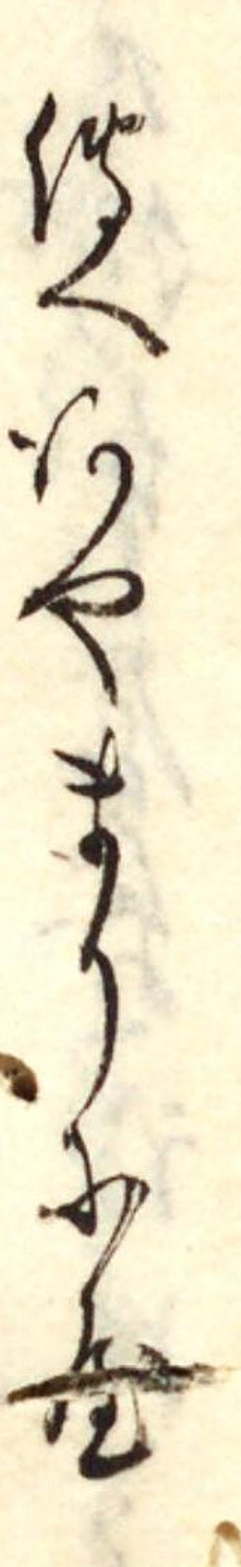伝へあやまりにや
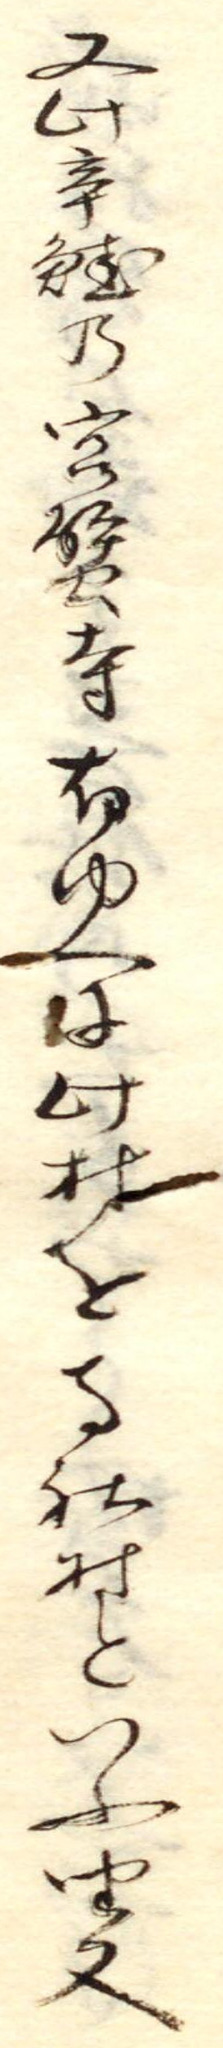又此辛鮭の宮蟹寺有ゆへは此村を寺社村といふ由又
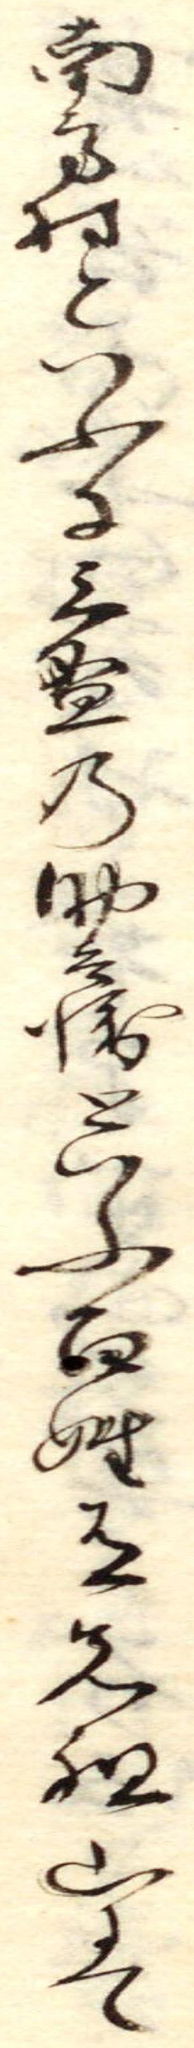南方村といふに三盃の助兵衛といふ百姓有先祖山にて
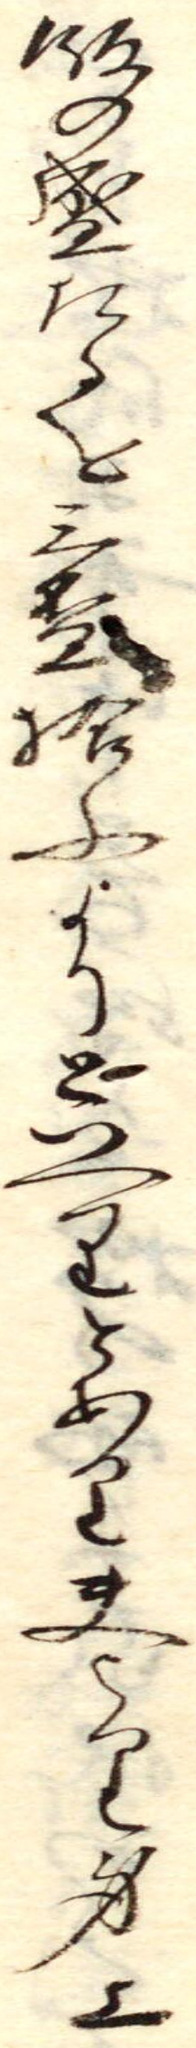飯の盛たるを三盃拾ふよりといへりとあり夫より身上
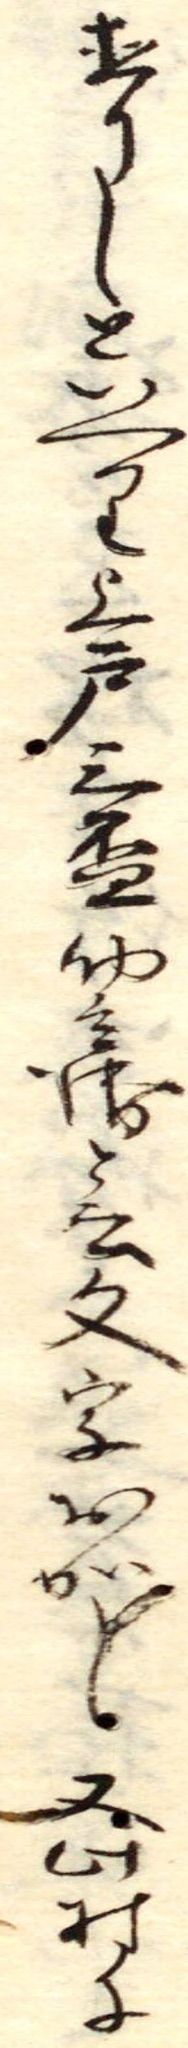直りしといへり上戸三盃助兵衛と云文字おかし又此村千
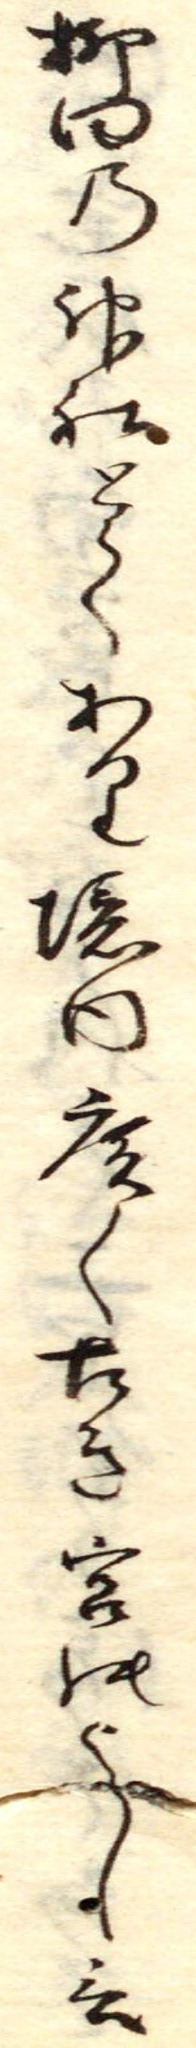柳田の神社とてあり境内広〳〵古き宮のよし云
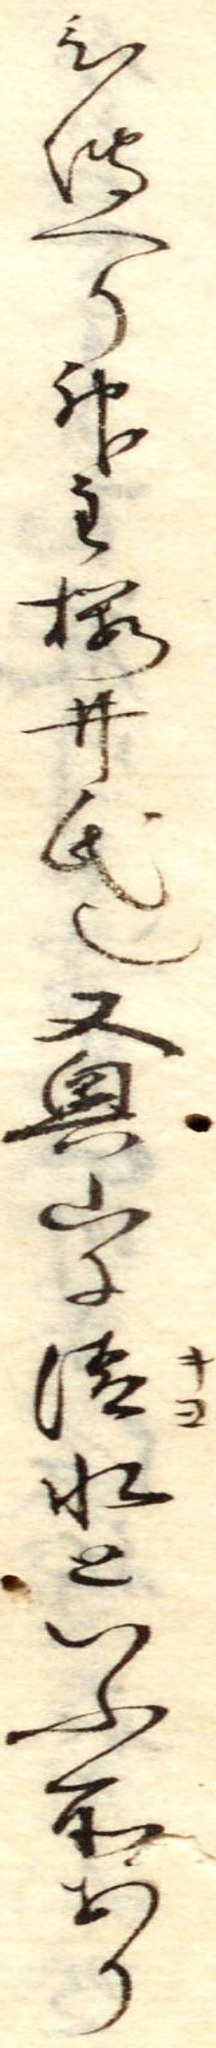ひ伝へり神主桜井志氏也又奥山に清水といふ所あり
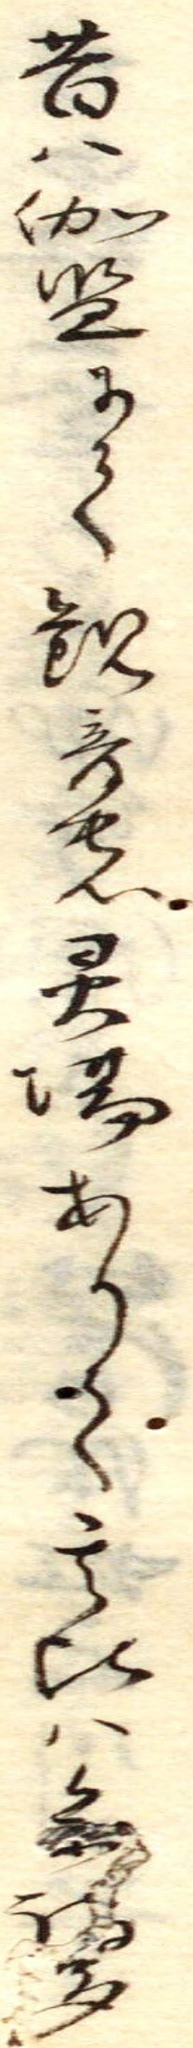昔は伽藍にて観音の霊場ありて其頃は参詣多
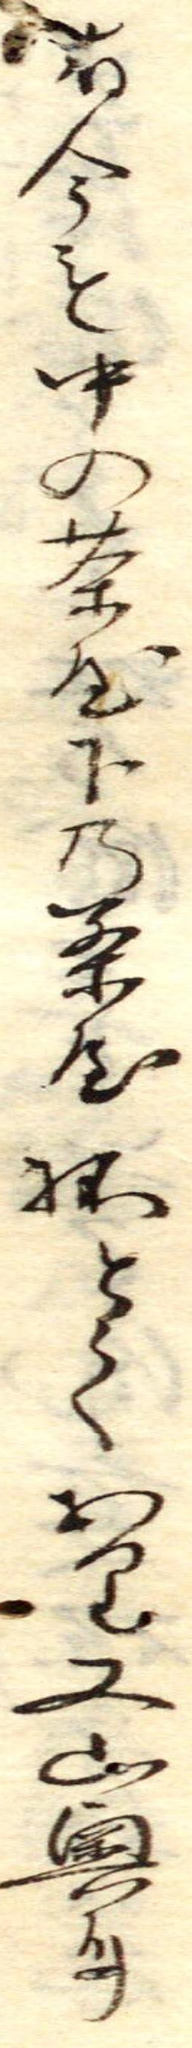有今も中の茶屋下の茶屋抔とてあり又奥山に

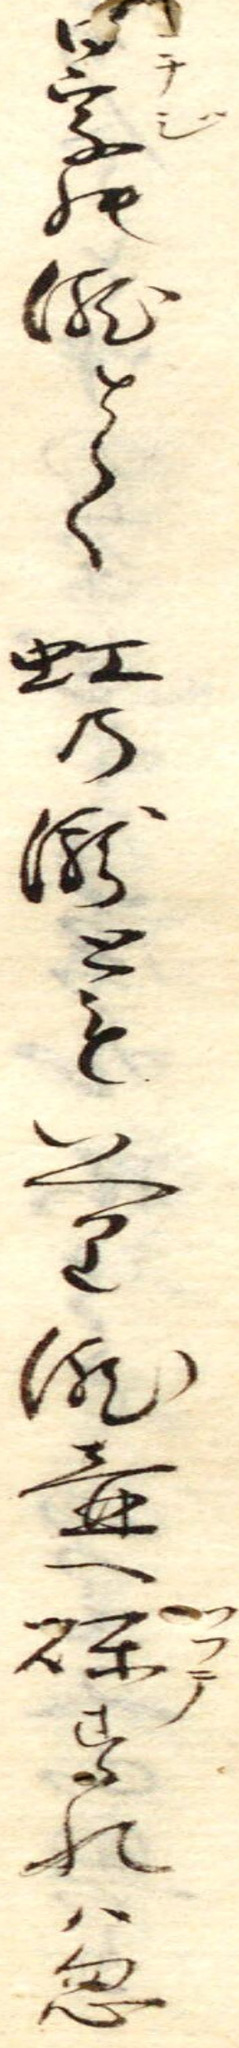日字の瀧とてに虹の瀧ともいへり瀧壺へ礫すれは忽
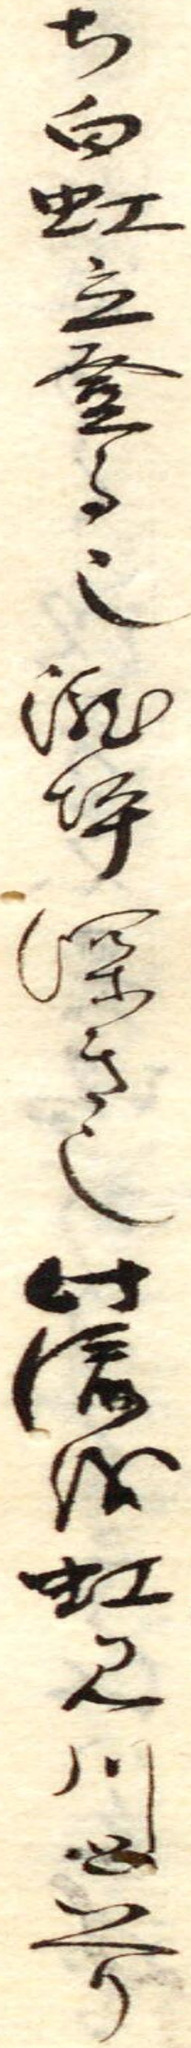ち白虹立登る也瀧坪ふ深き也此流を虹見川といへり
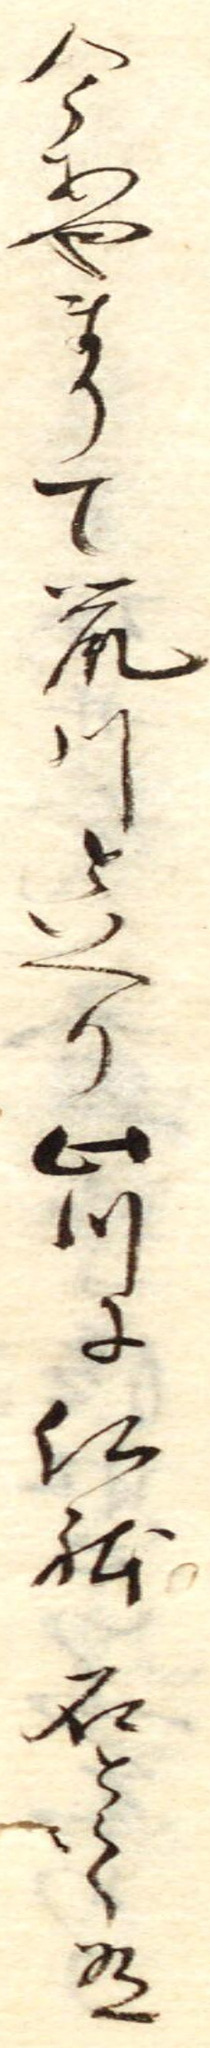今あやまりて鼠川といへり此川に仏躰石とて有
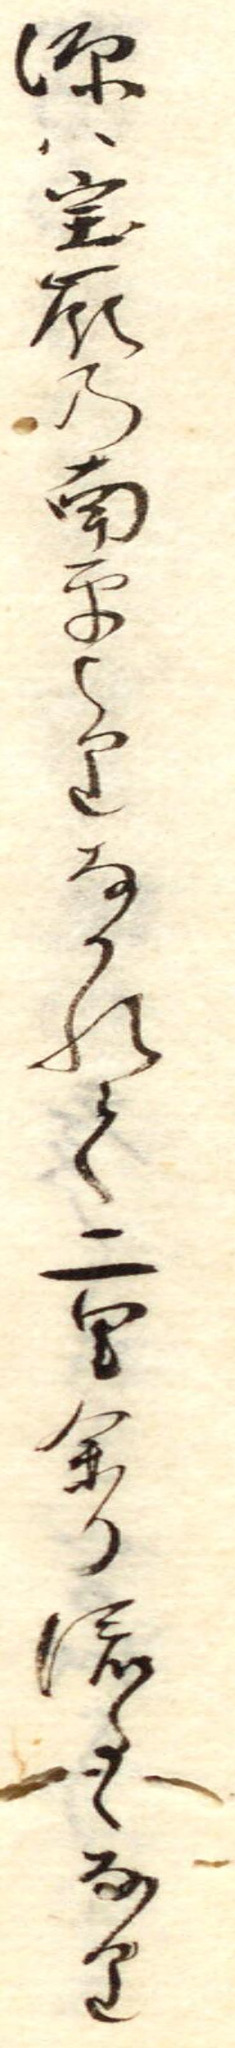源は宝嶺の南平よりなかれて二里余り流るゝなり
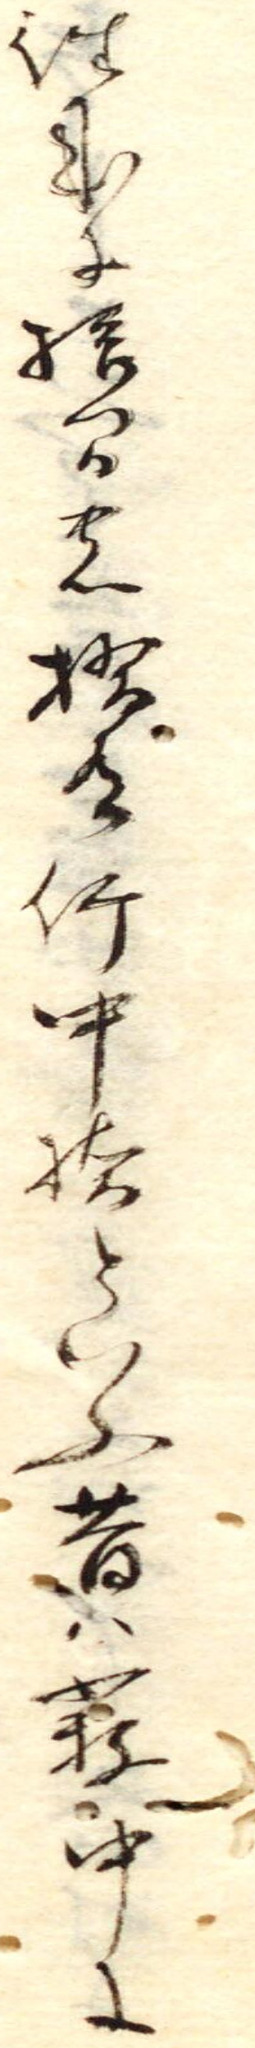往来に拾間の橋有竹中橋といふ昔は藪中に
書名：能登名跡誌
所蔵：Ishikawa Prefectural Library
